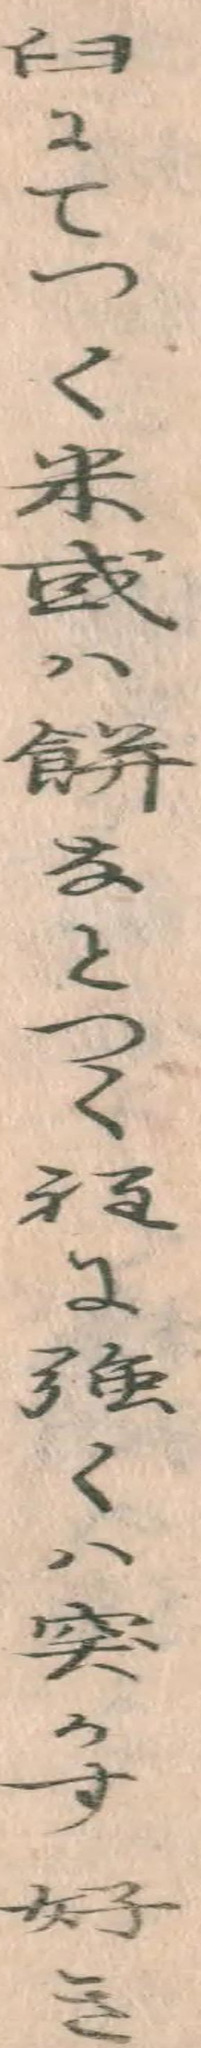臼にてつく米或は餅なとつく程に強くは突かす好き
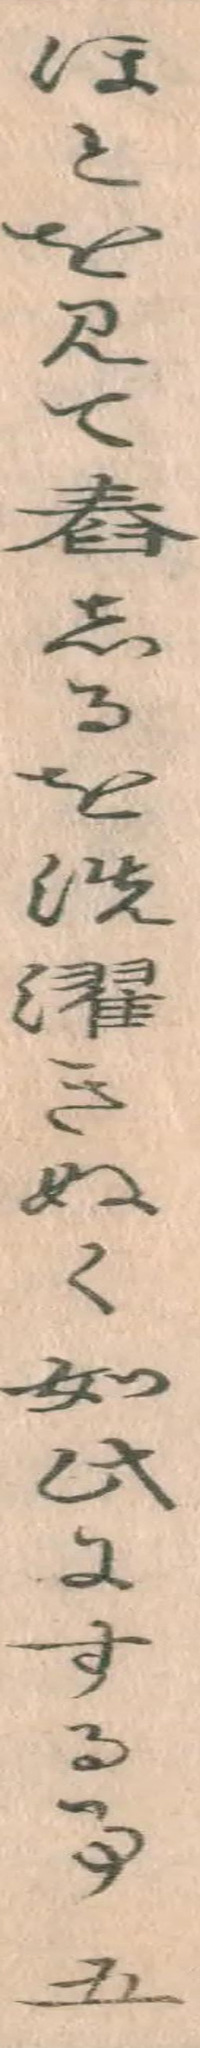ほとを見て舂しるを洗濯きぬく如此にする事五
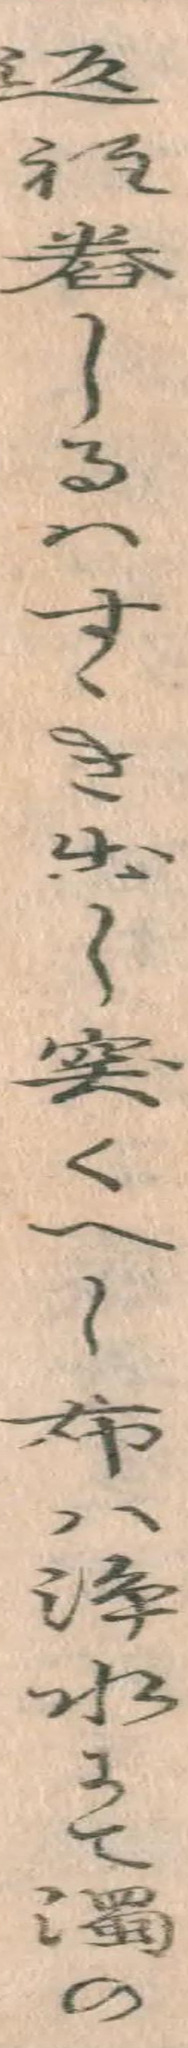返程舂しるはすゝき出し突くへし布は浄水にて濁の
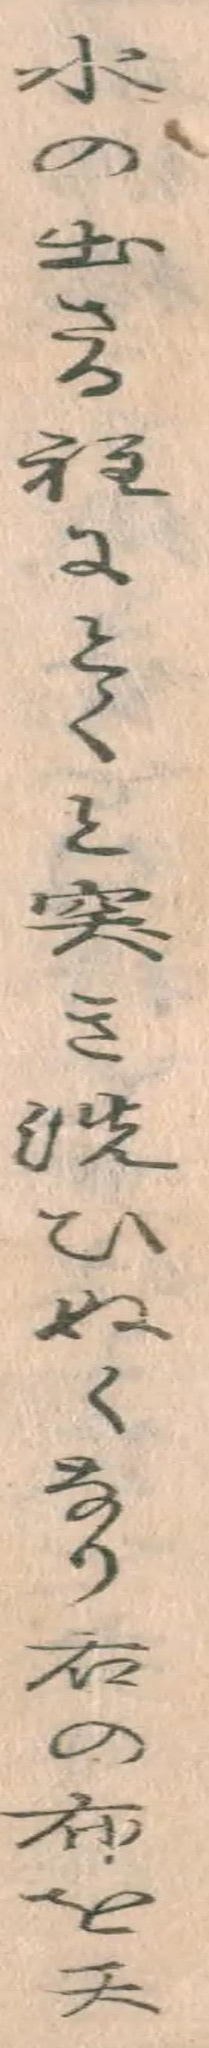水の出さる程にとくと突き洗ひぬくなり右の布を天
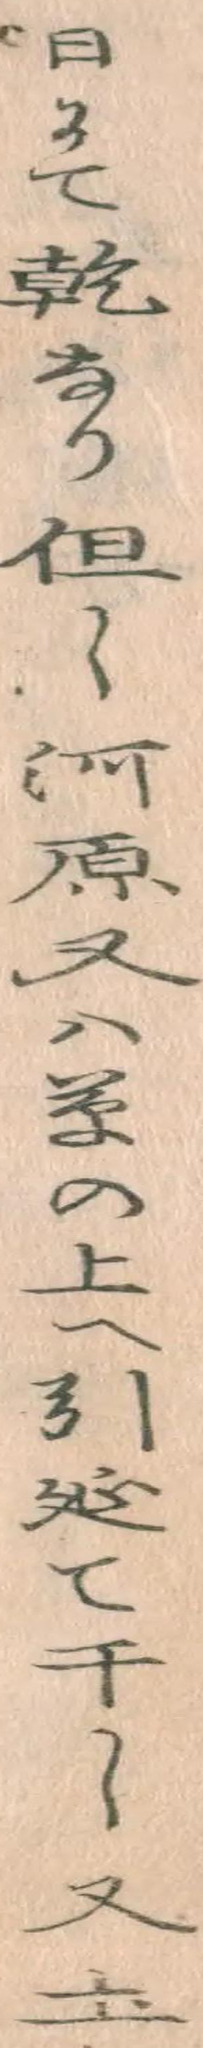日にて乾なり但し河原又は草の上へ引延て干し又土
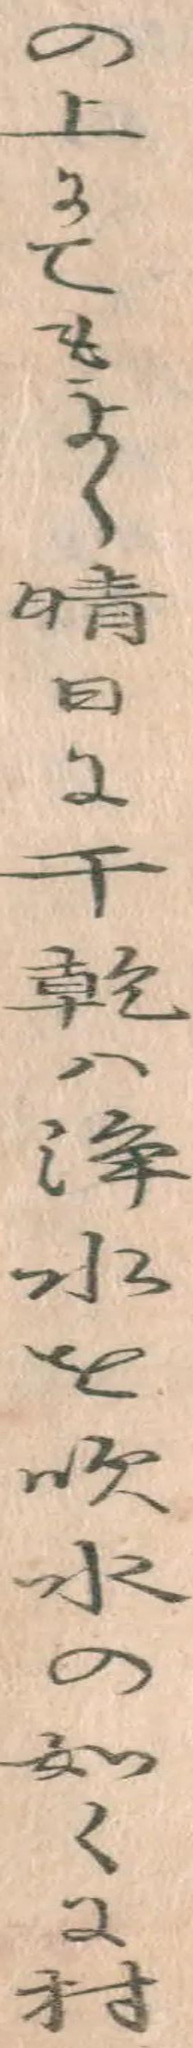の上にてもよし晴日に干乾は浄水を吹水の如くに村
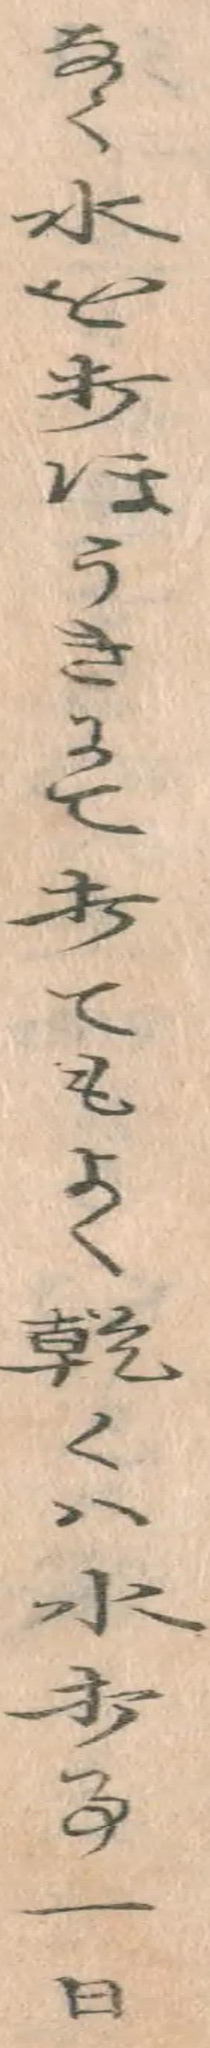なく水を打ほうきにて打てもよく乾くは水打事一日
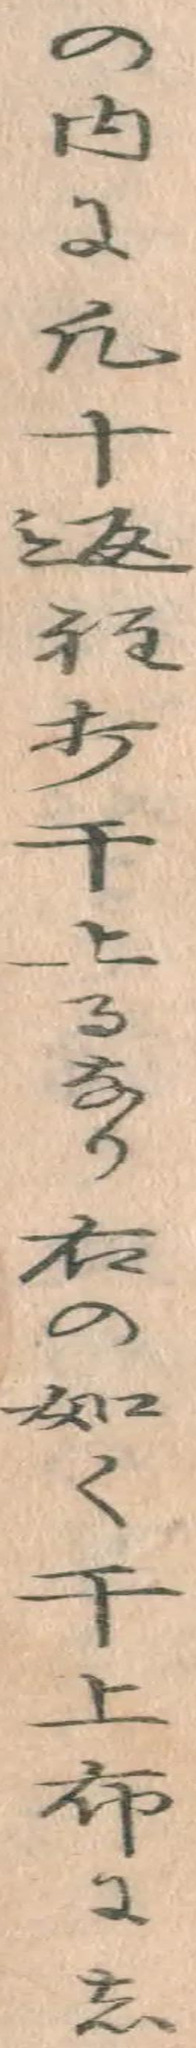の内に凡十返程打干上るなり右の如く干上布にし

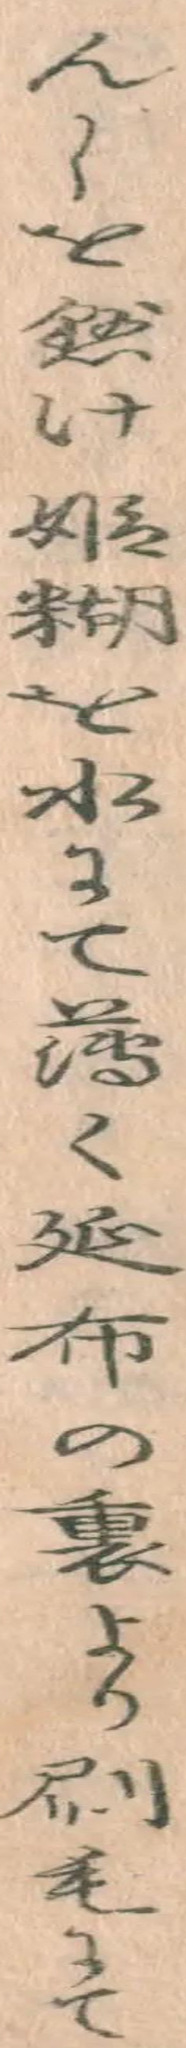んしを懸け姫糊を水にて薄く延布の裏より刷毛にて
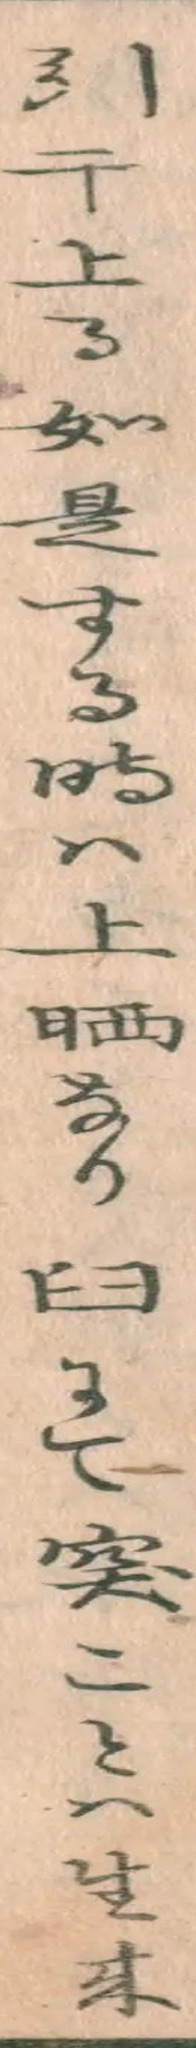引干上る如是する時は上晒なり臼にて突ことは生来
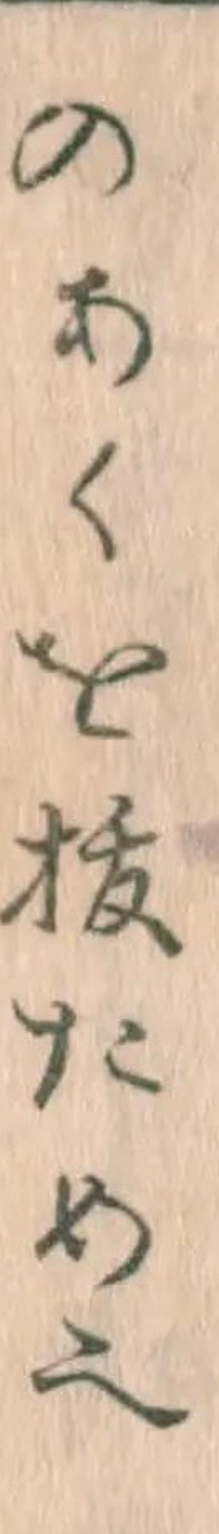のあくを抜ため也
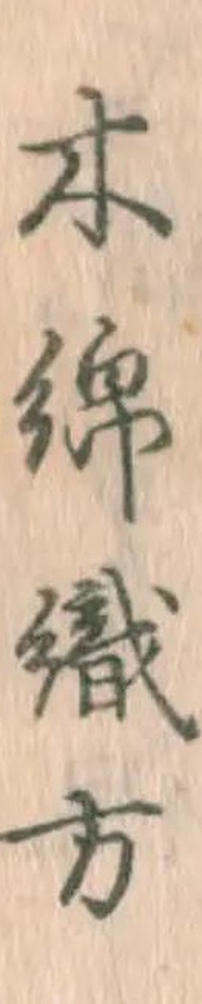木綿織方
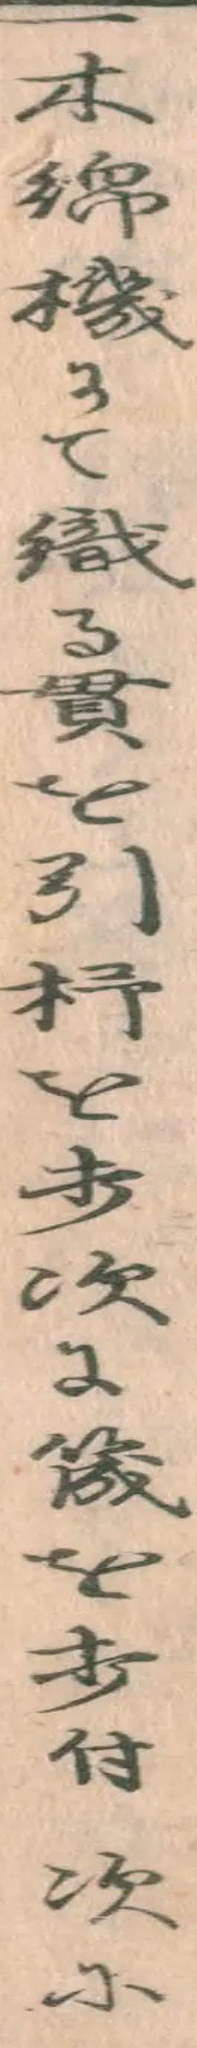一木綿機にて織る貫を引杼を打次に筬を打付次に
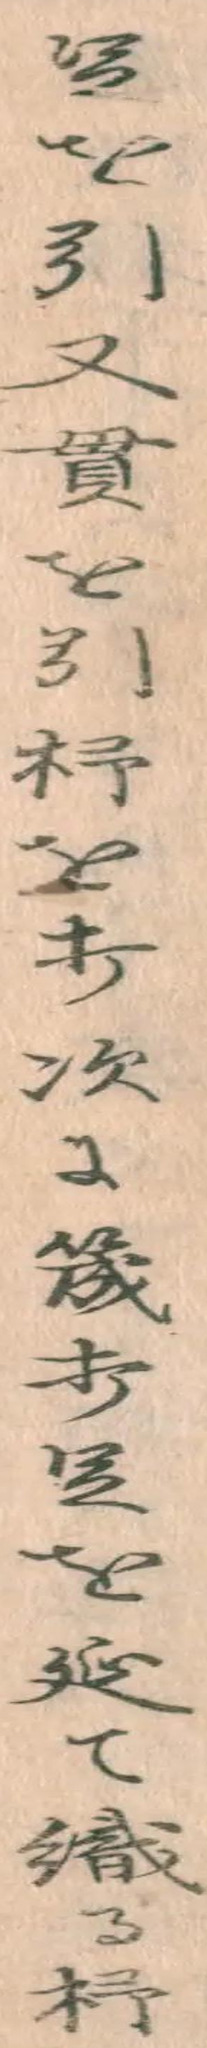足を引又貫を引杼を打次に筬打足を延て織る杼
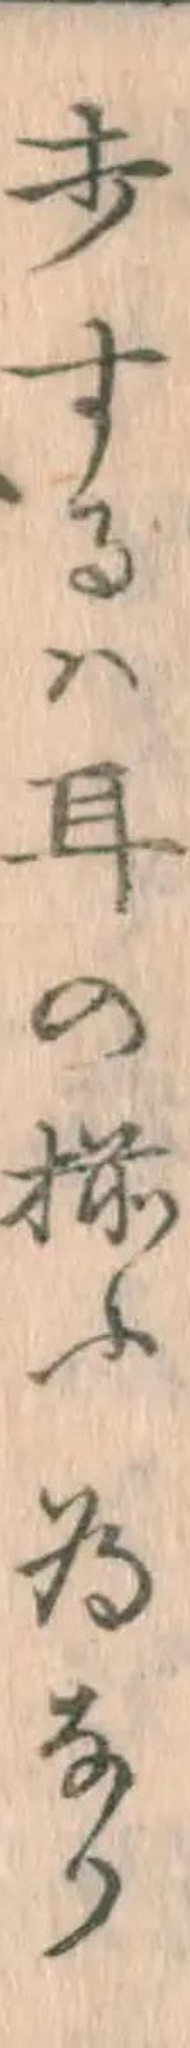打するは耳の揃ふ為なり
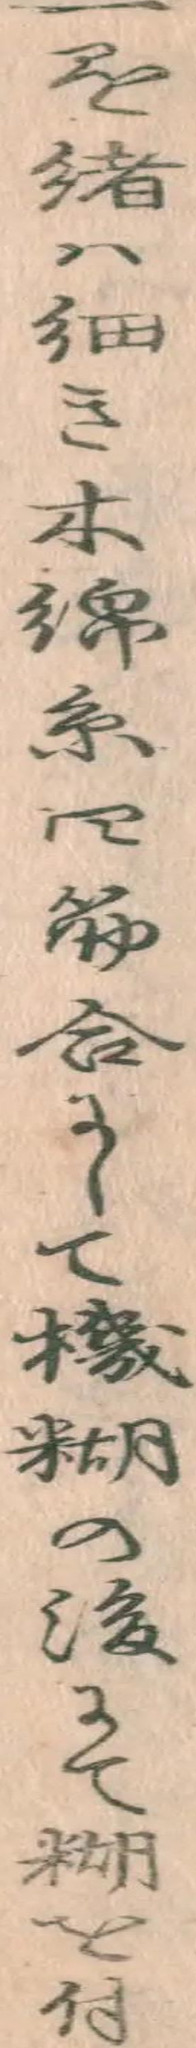一懸緒は細き木綿糸四筋合にして機糊の後にて糊を付
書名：機織彙編 5巻. [2]
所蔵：国立国会図書館 National Diet Library, JAPAN
